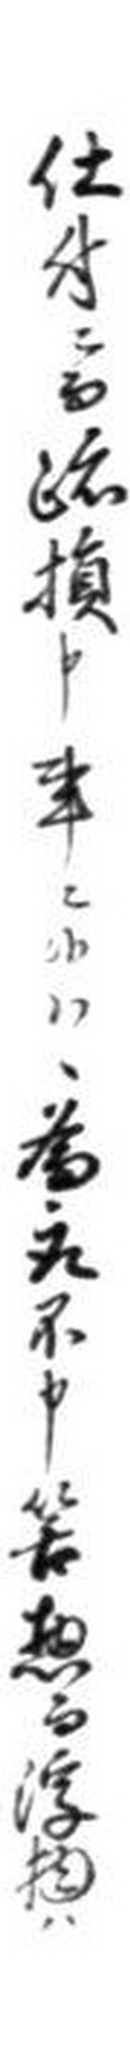仕付ニ而跡損申事ニ候ハヽ為取不申筈惣而浮物ハ
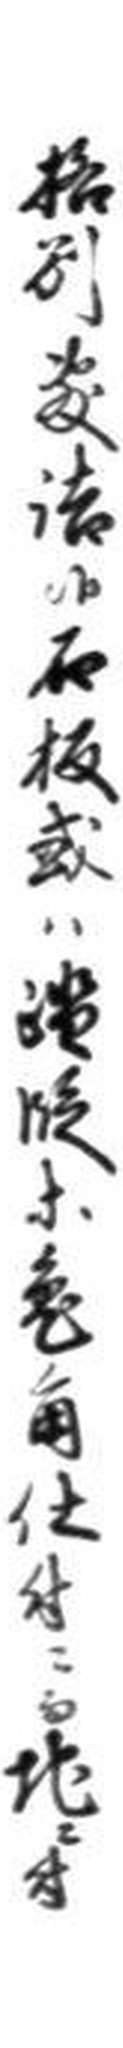格別敷詰候石板或ハ踏段等兎角仕付ニ而地ニ付
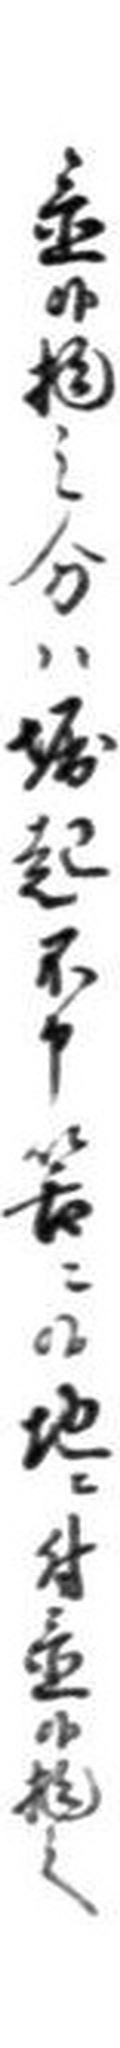置候物之分ハ堀起不申筈ニ候地ニ付置候物之
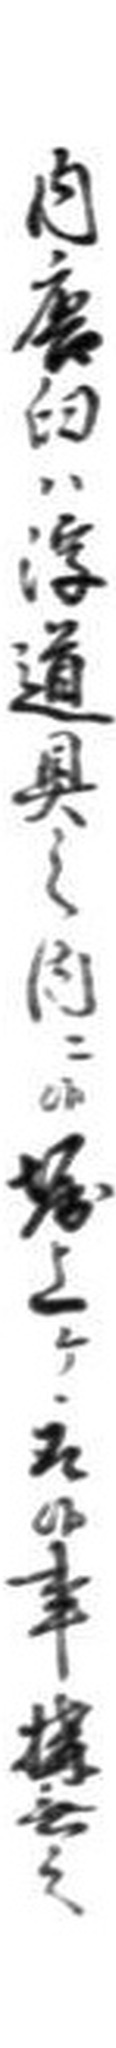内唐臼ハ浮道具之内ニ候堀上ケ取候事構無之
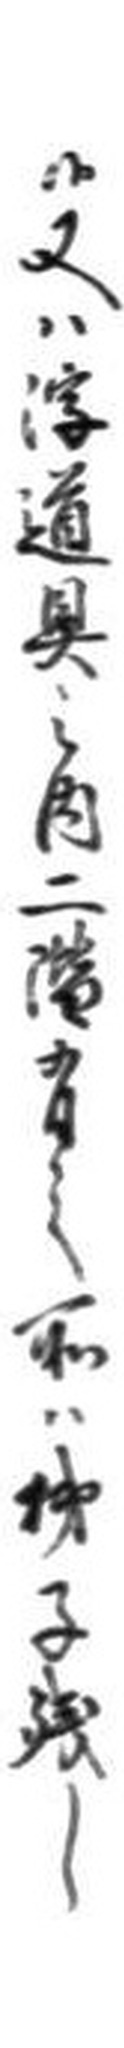候又ハ浮道具之内二階有之所ハ梯子残し
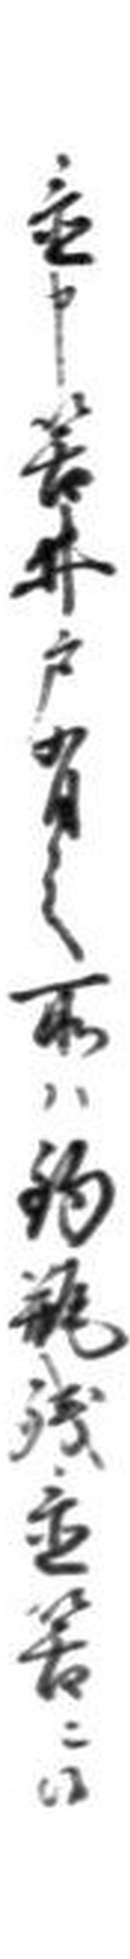置申筈井戸有之所ハ釣瓶残置筈ニ候
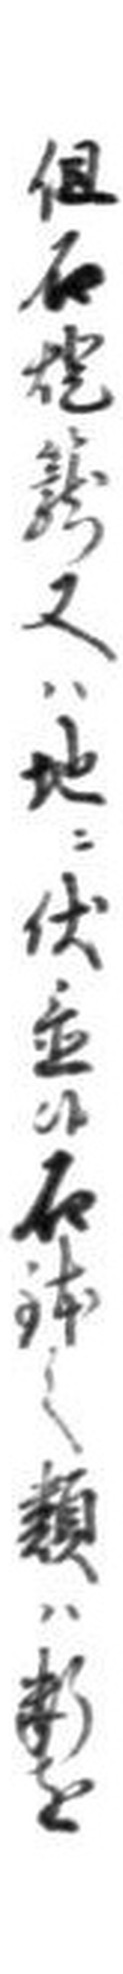但石燈籠又ハ地ニ伏置候石鉢之類ハ断を
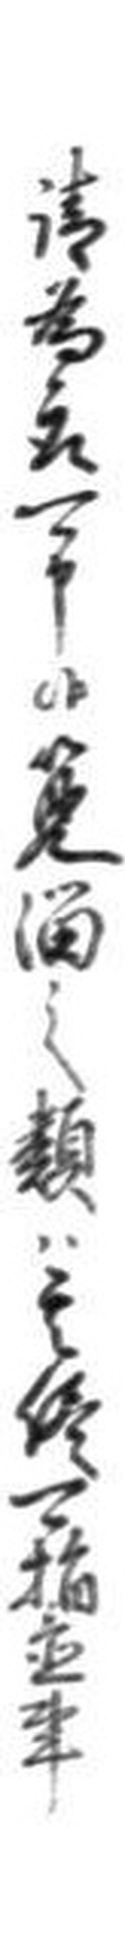請為取可申候筧溜之類ハ其儘可指置事
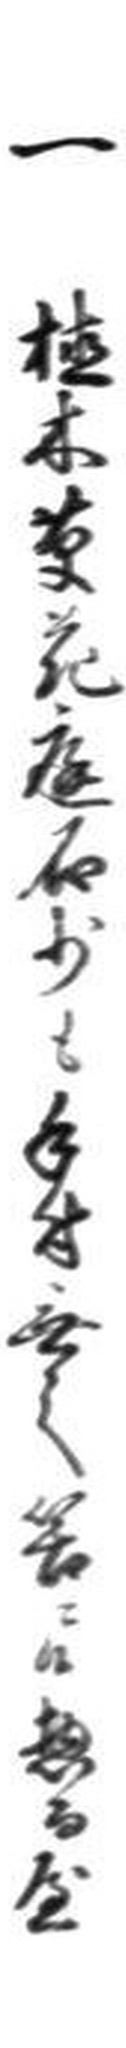一植木草花庭石少も手付無之筈ニ候惣而屋
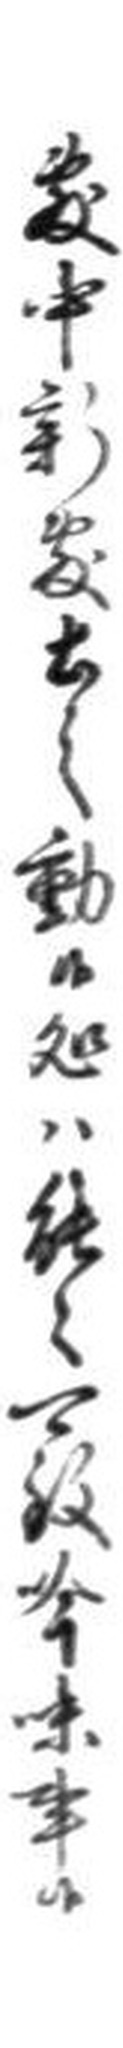敷中新敷土之動候処ハ能々可致吟味事候
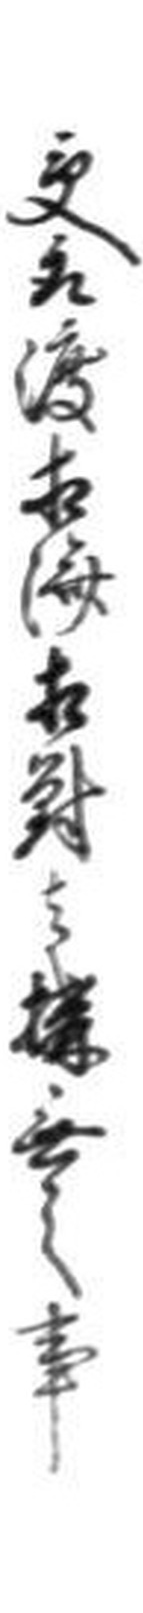受取渡相済相対者構無之事

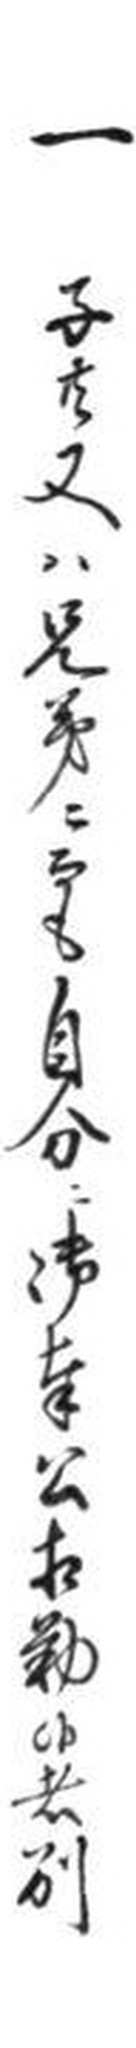一子共又ハ兄弟ニ而も自分ニ御奉公相勤候者別
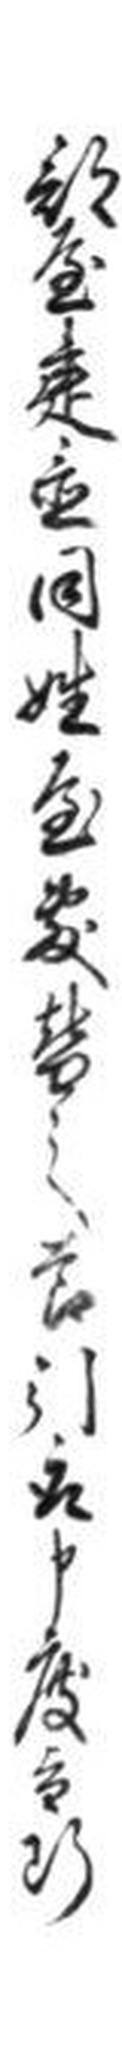部屋建置同姓屋敷替之節引取申度旨断
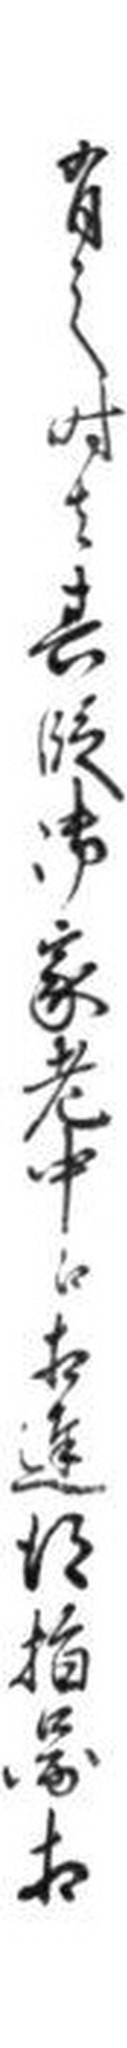有之時者其段御家老中江相達得指図相
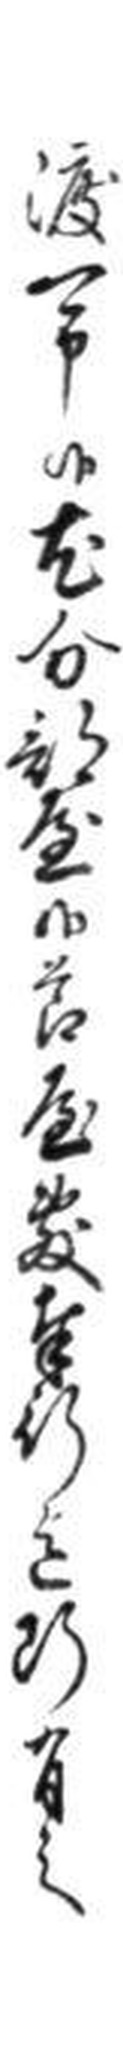渡可申候尤分部屋候節屋敷奉行迄断有之
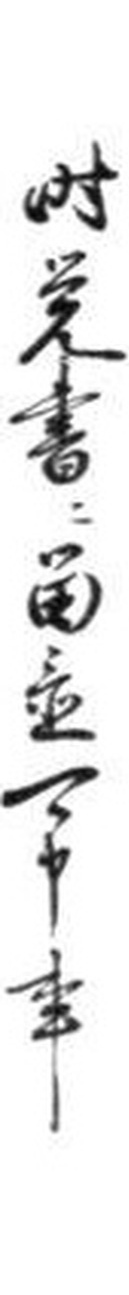時覚書ニ留置可申事
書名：家譜 三十二 吉邦公 従享保二年到享保三年
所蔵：福井県文書館 Fukui Prefectural Archives
